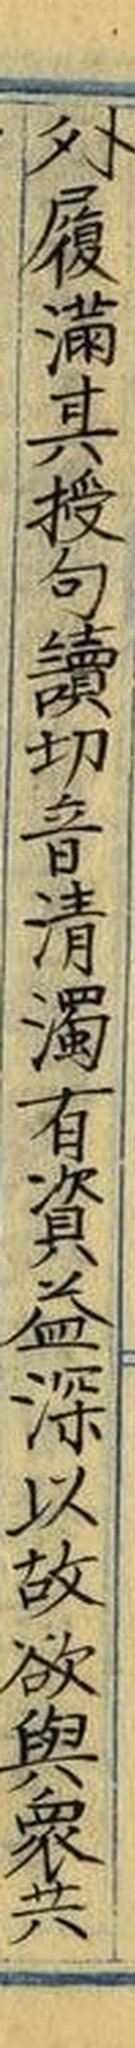外履滿其授句讀切音清濁有資益深以故欲與衆共
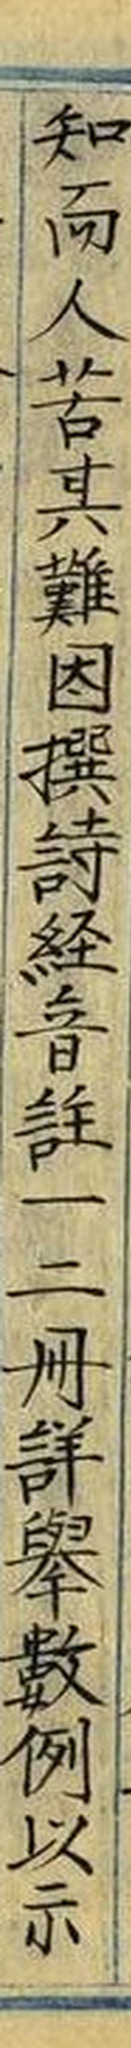知而人苦其難因撰詩経音註一二冊詳擧數例以示
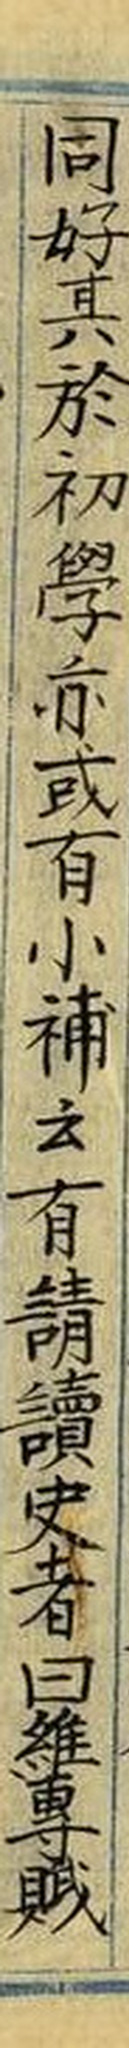同好其於初學亦或有小補云有請讀史者曰維専賦
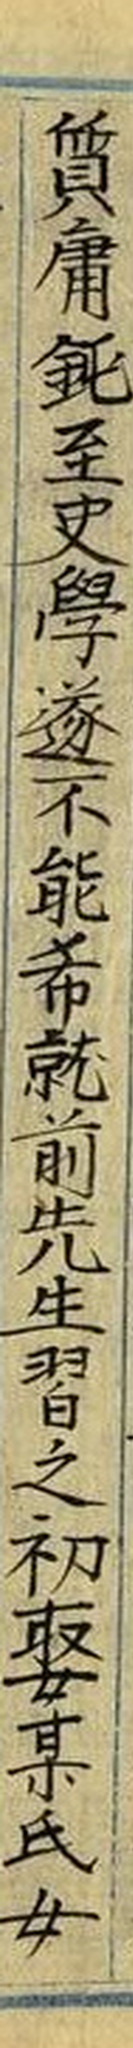質庸鈍至史學遂不能希就前先生習之初娶某氏女
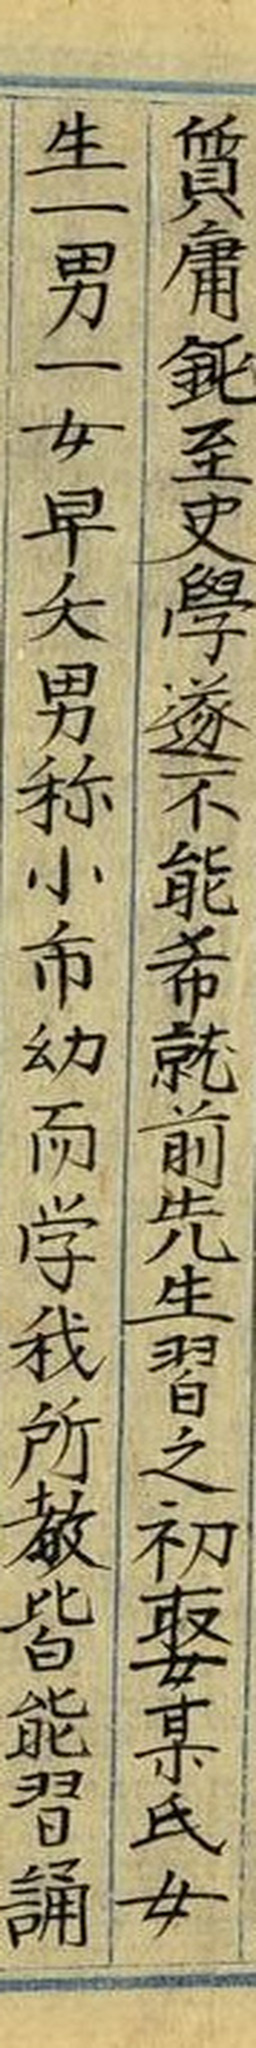生一男一女早夭男称小市幼而学我所教皆能習誦
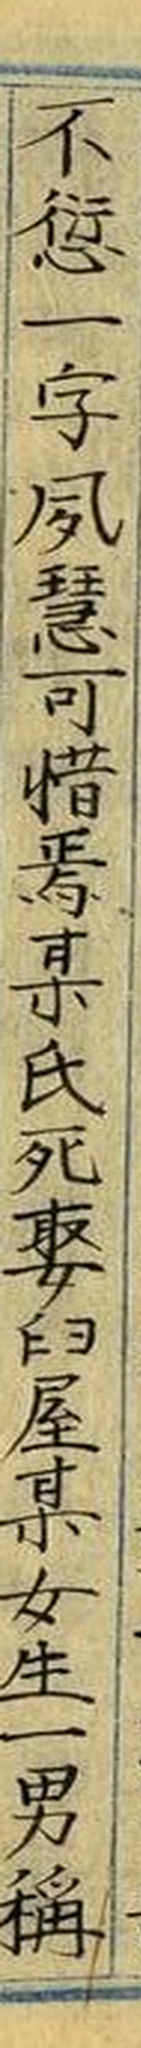不愆一字夙慧可惜焉某氏死娶臼屋某女生一男稱
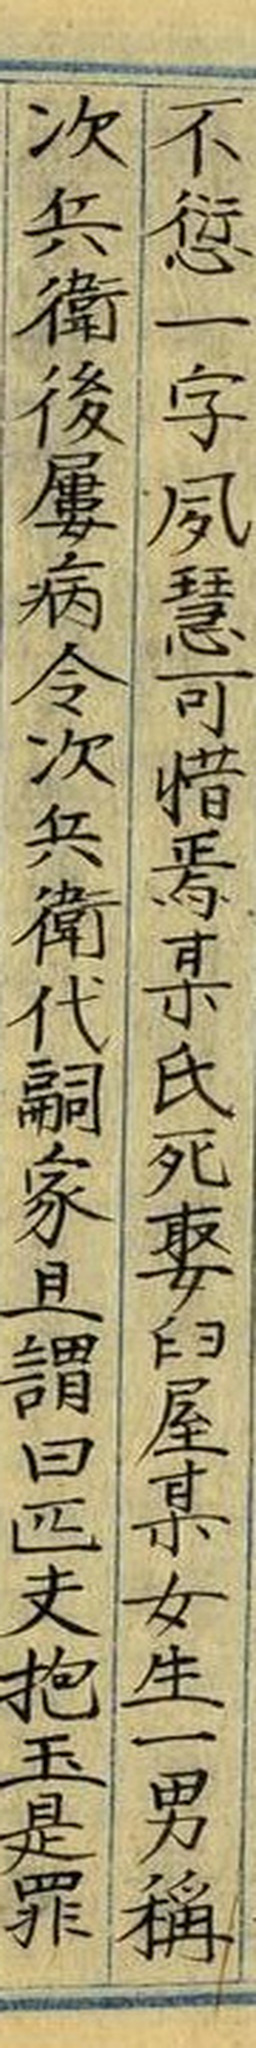次兵衛後屢病令次兵衛代嗣家且謂曰匹夫抱玉是罪
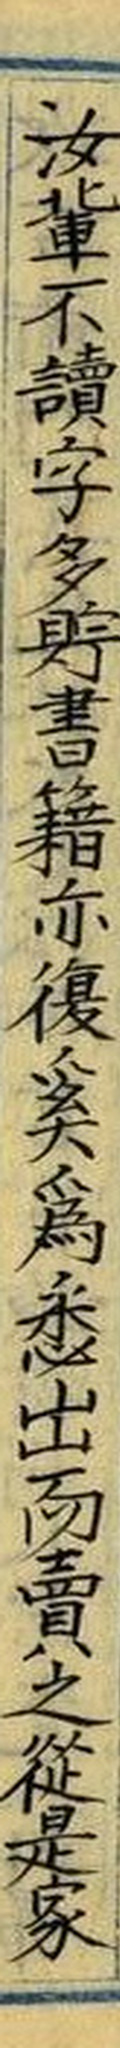汝軰不讀字多貯書籍亦復奚爲悉出而賣之從是家
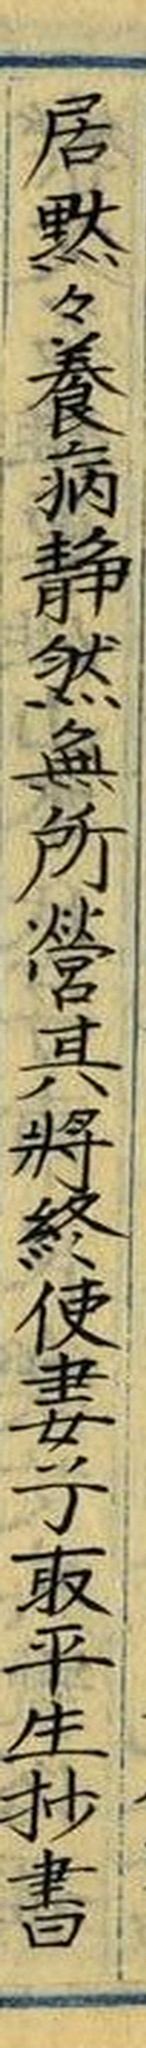居黙々養病静然無所營其將終使妻子取平生抄書
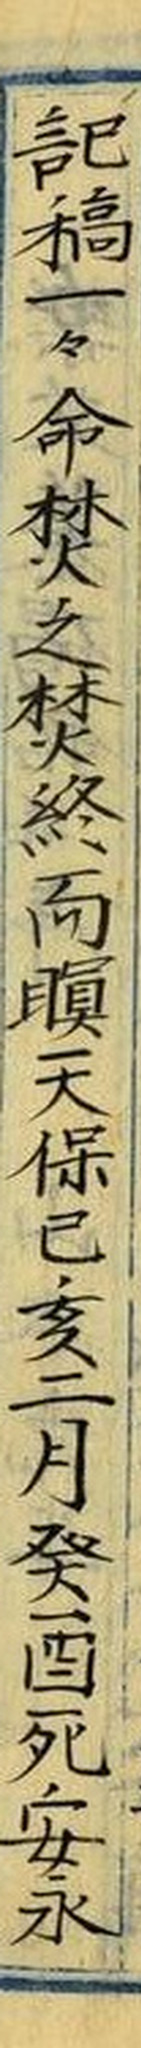記稿一々命焚之焚終而瞑天保己亥二月癸酉死安永
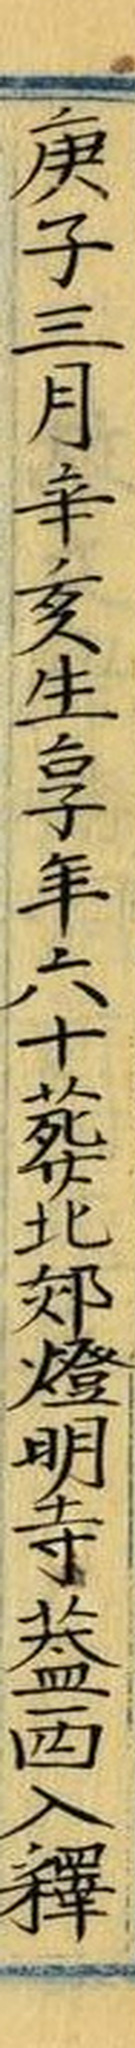庚子三月辛亥生享年六十葬北郊燈明寺葢西入釋
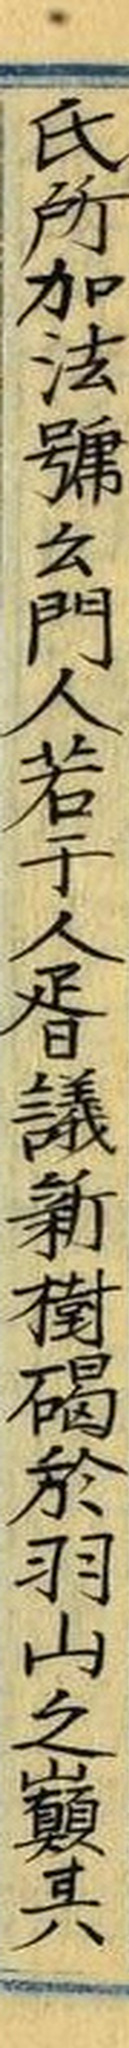氏所加法號云門人若干人胥議新樹碣於羽山之巓其
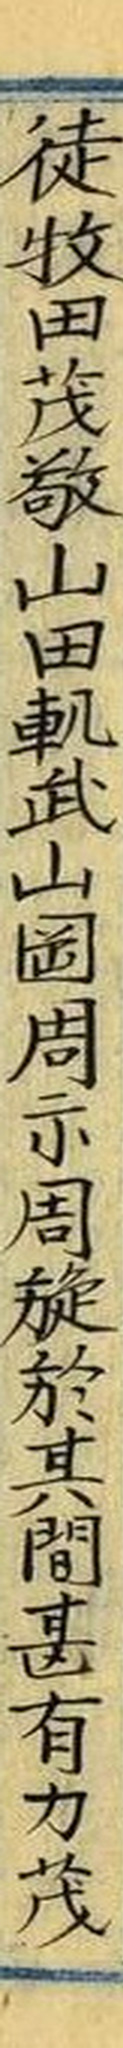徒牧田茂敬山田軌武山岡周示周旋於其間甚有力茂
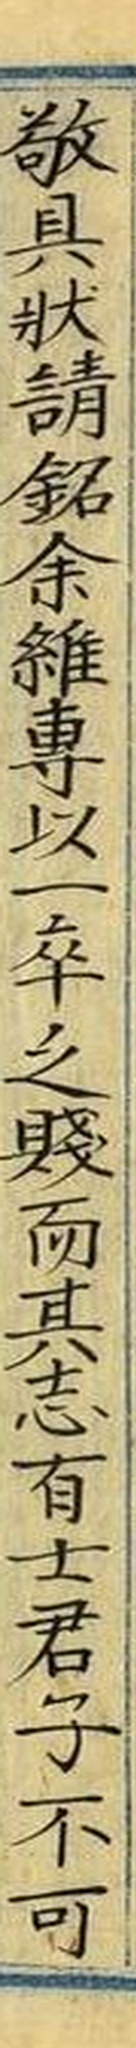敬具狀請銘余維専以一卒之賤而其志有士君子不可
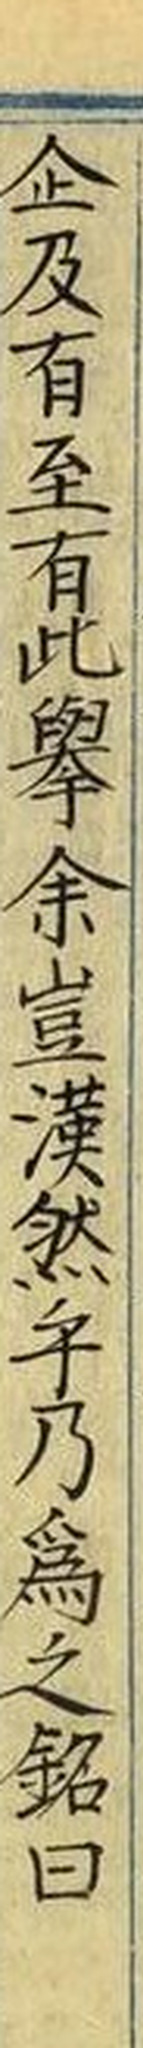企及有至有此擧余豈漢然乎乃為之銘曰
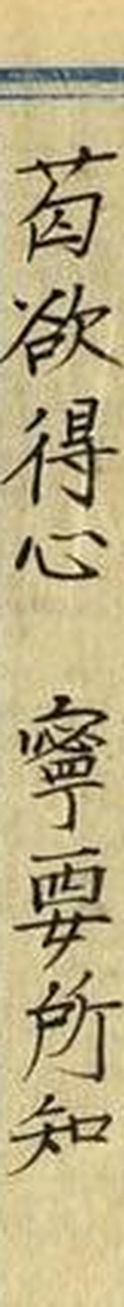欲得心寧要所知
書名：温古集 四巻
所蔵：福井県文書館 Fukui Prefectural Archives
